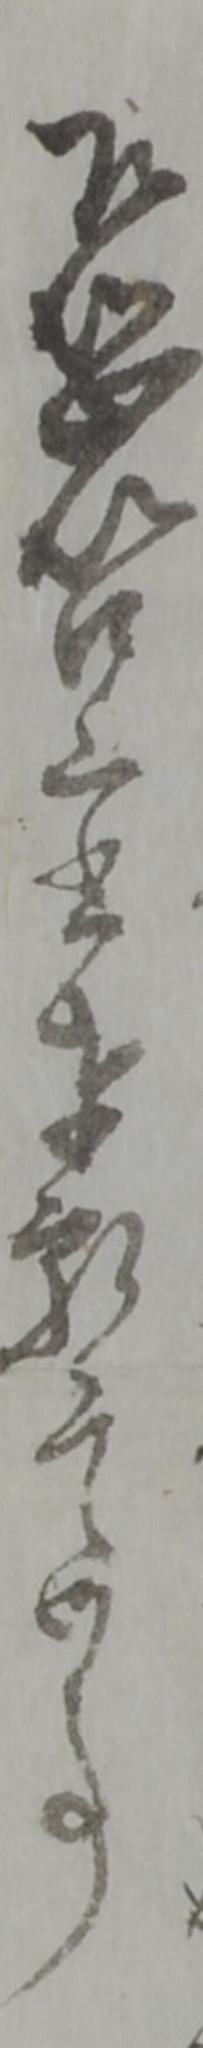乍恐以口上書奉願上候御事
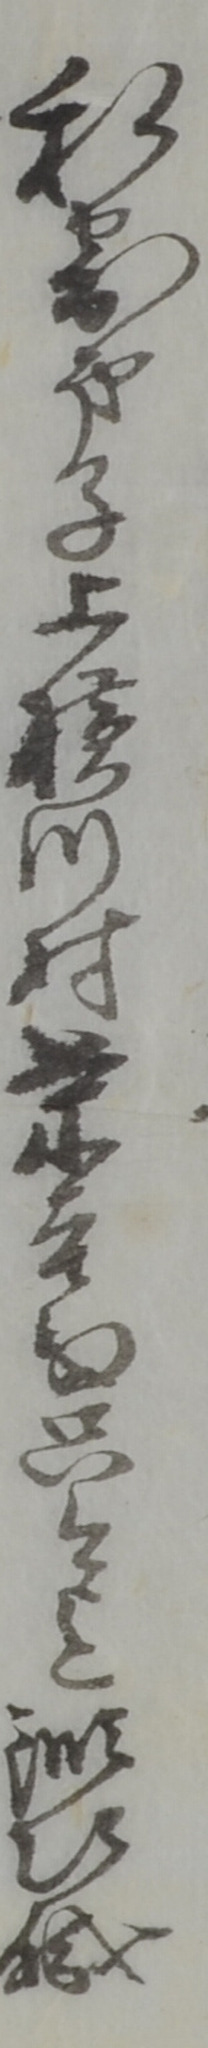私寄弟子上横川村栄吉義只今迄鍛冶職
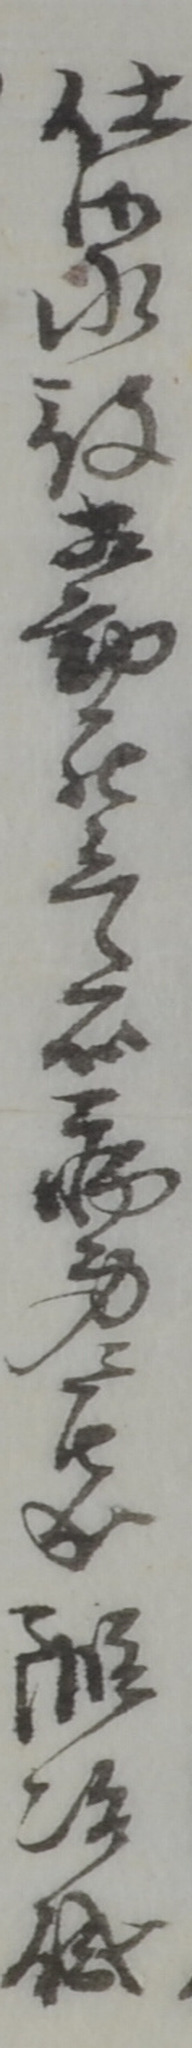仕御水役相勤罷在候所病身ニ罷成鍛冶職
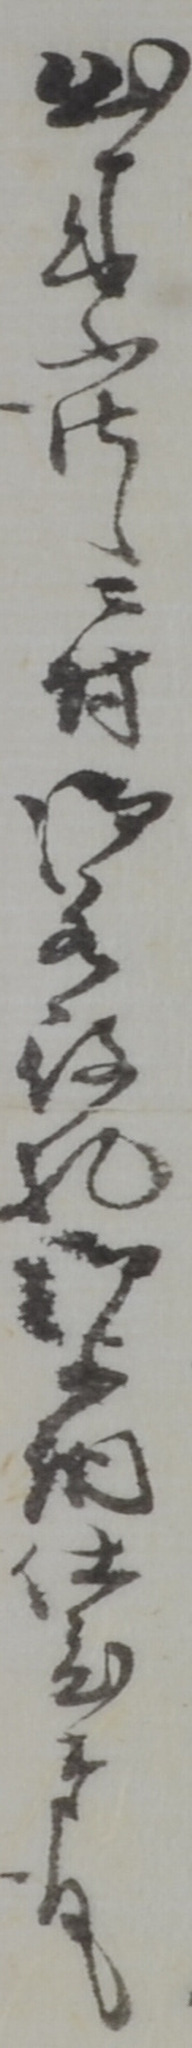出来不仕候ニ付御水役札御上納仕度奉存候
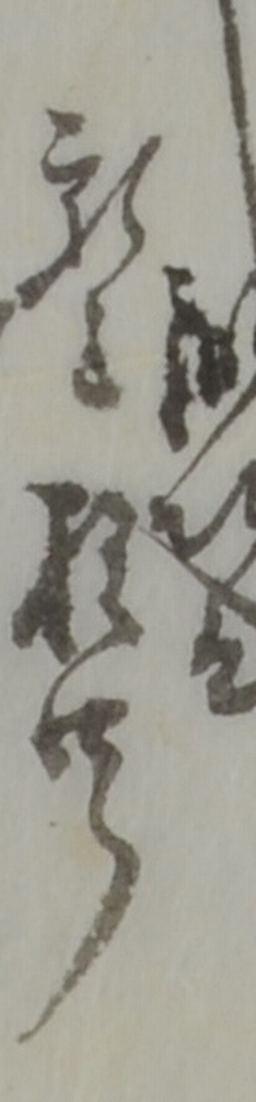願主権四郎
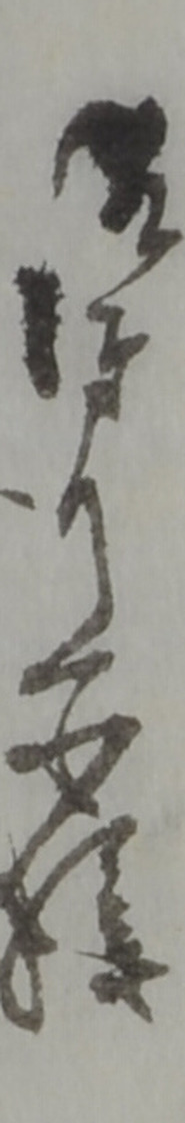御奉行所様
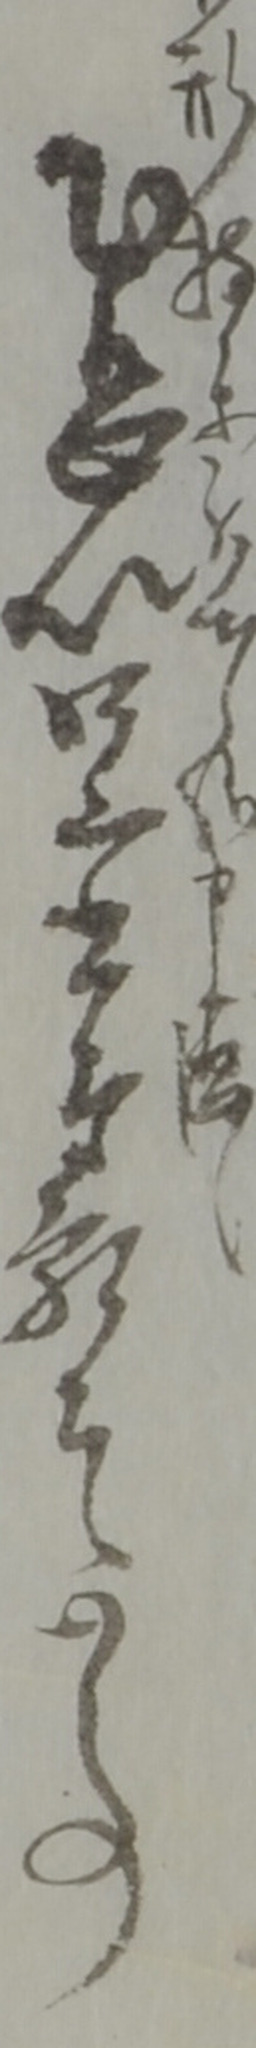乍恐以口上書奉願上候御事
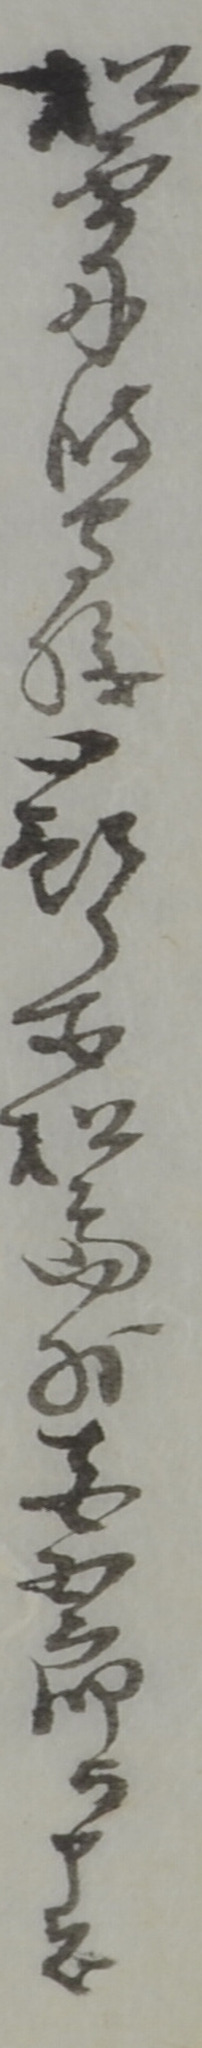松平丹波守様御預所松島外宮五郎与申者
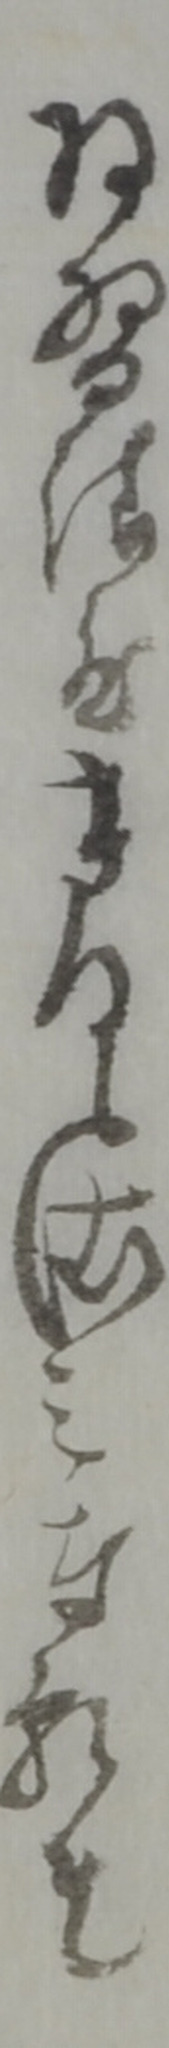為習請度奉存候依之奉願上候
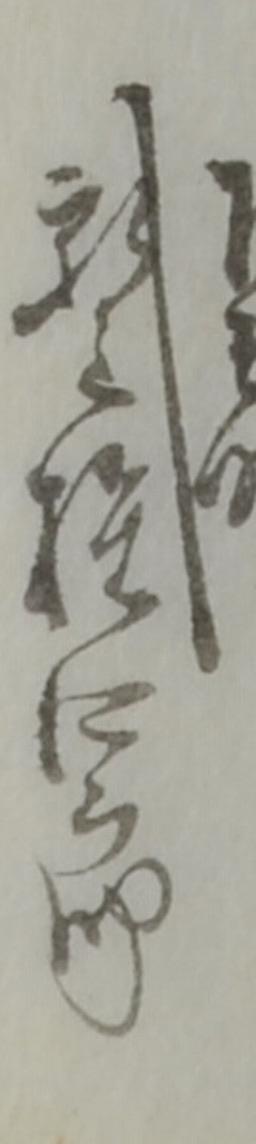願主権四郎

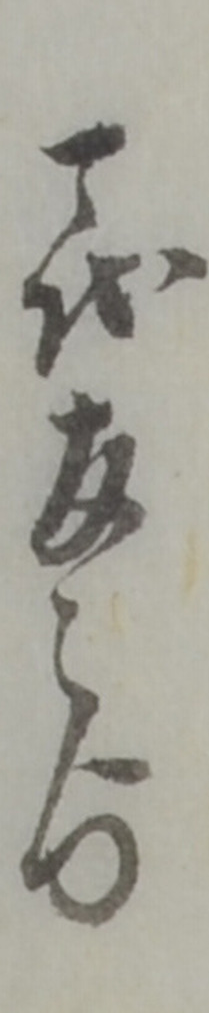丁代友右衛門
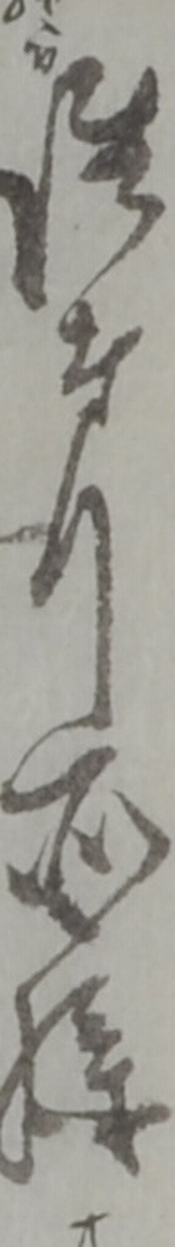御奉行所様
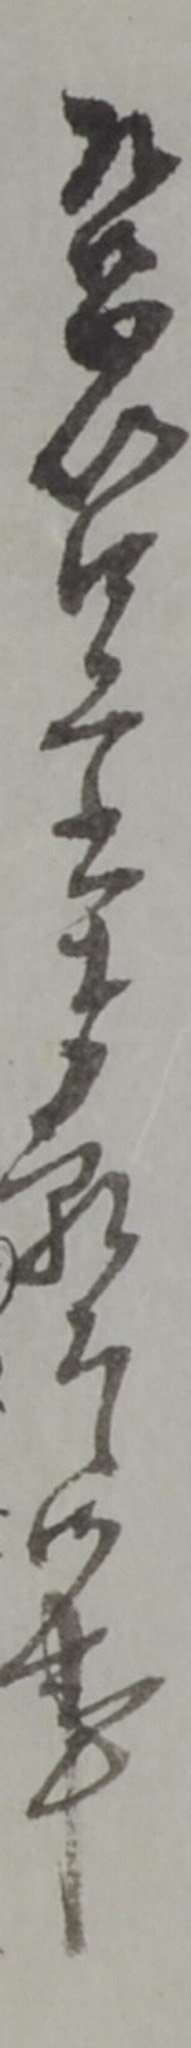乍恐以口上書奉願上候御事
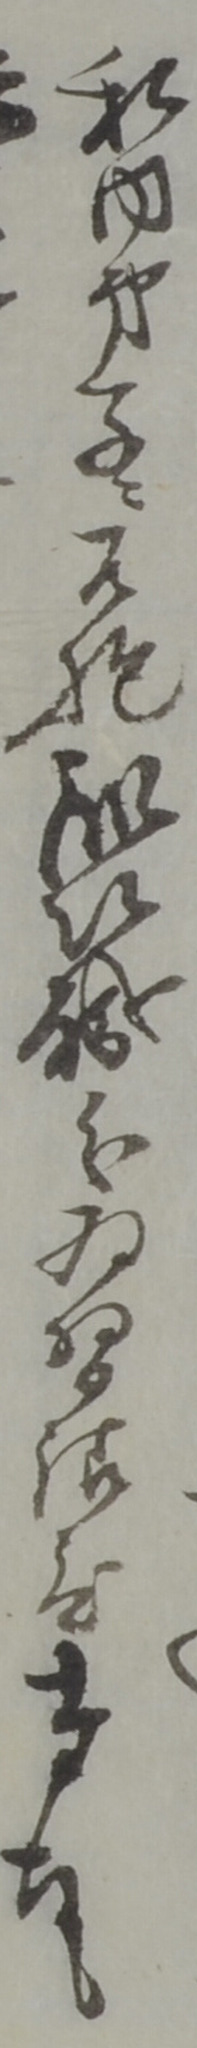私内弟子ニ召抱鍛冶職被為買請度奉存候
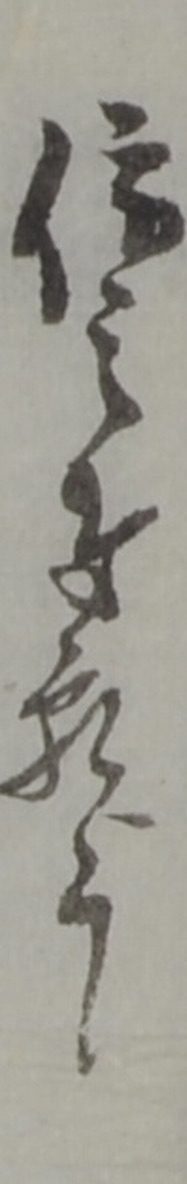依之奉願上候
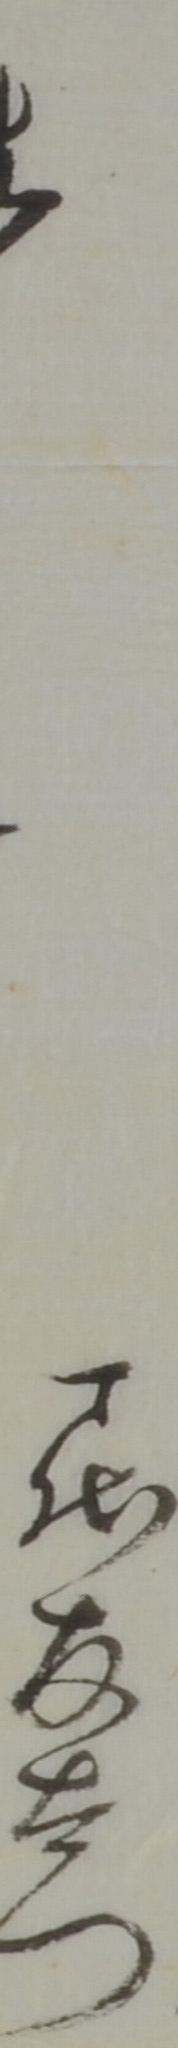丁代友右衛門
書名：諸願書控簿
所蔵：伊那市立高遠町図書館・合同会社AMANE
